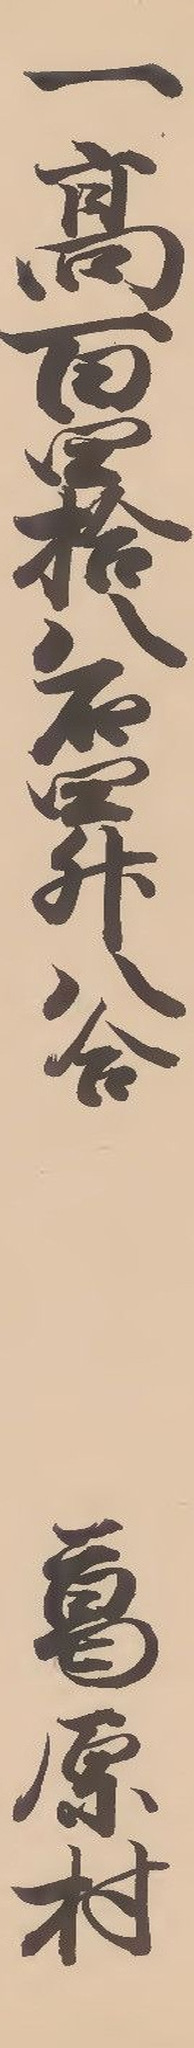一高百四拾八石四升八合葛原村
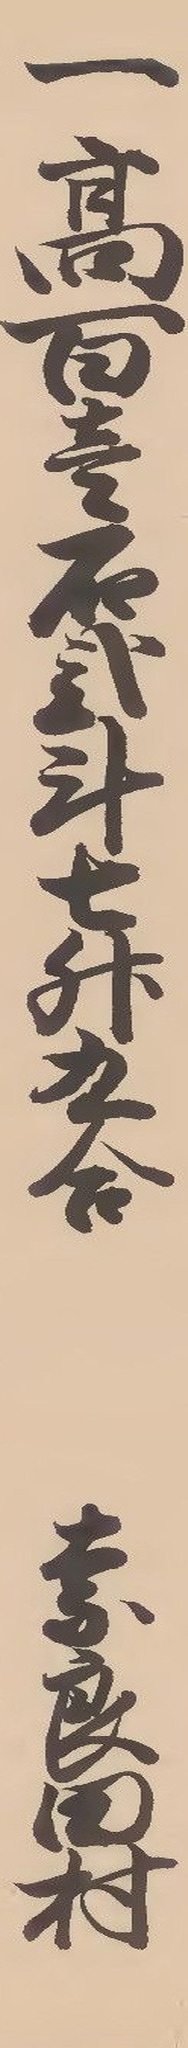一高百壱石弐斗七升九合奈良田村
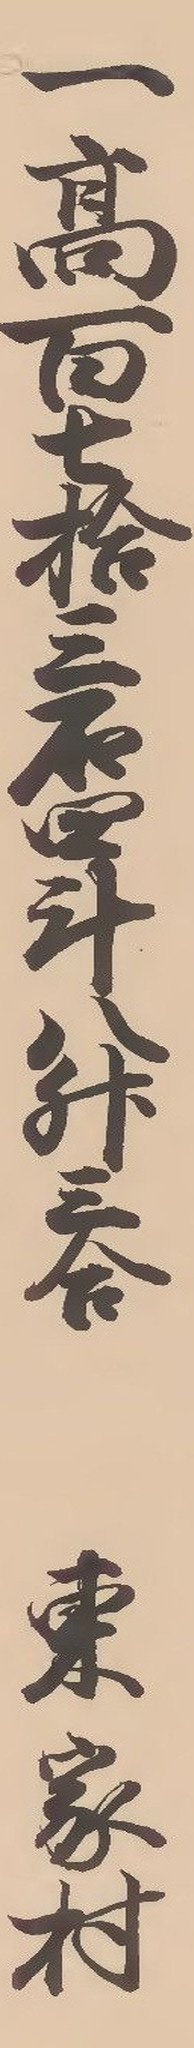一高百七拾三石四斗八升三合東家村
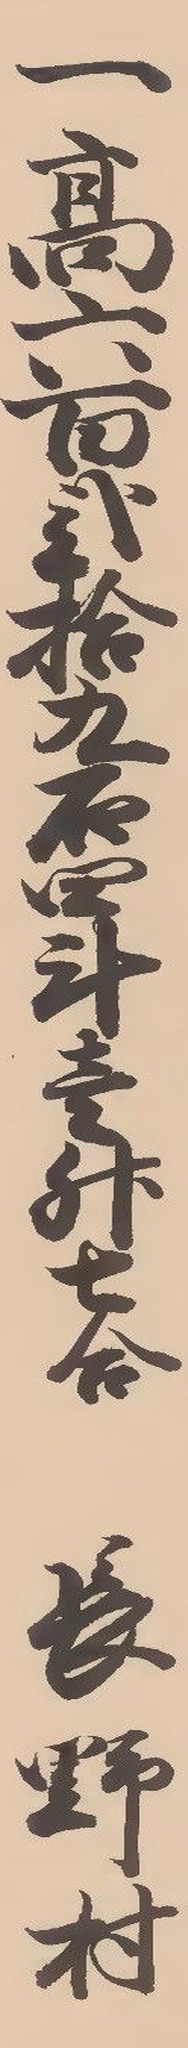一高六百弐拾九石四斗壱升七合長野村
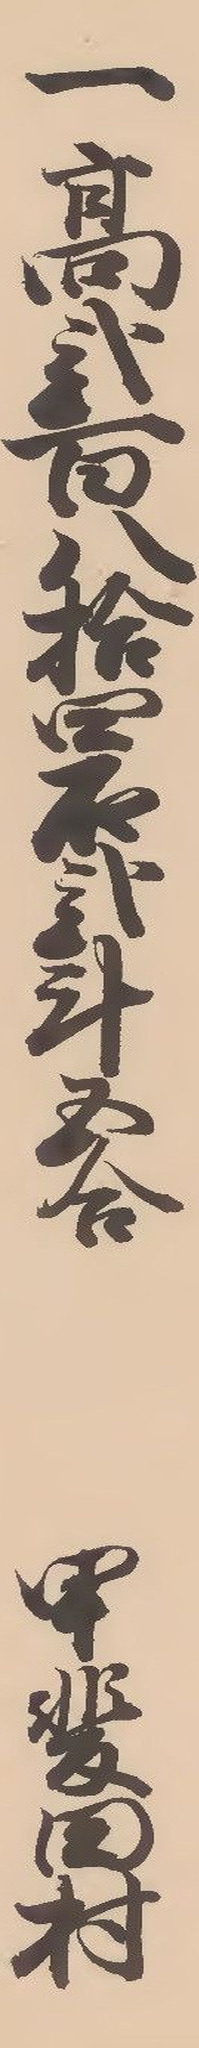一高弐百八拾四石弐斗五合甲斐田村
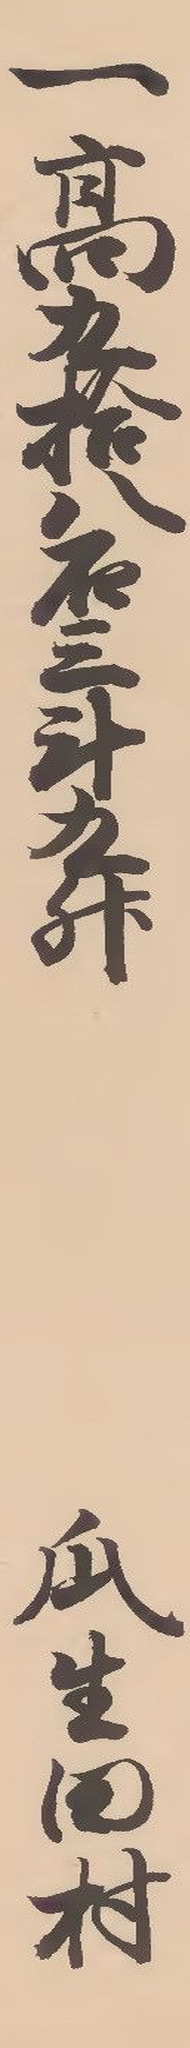一高九拾八石三斗九升瓜生田村
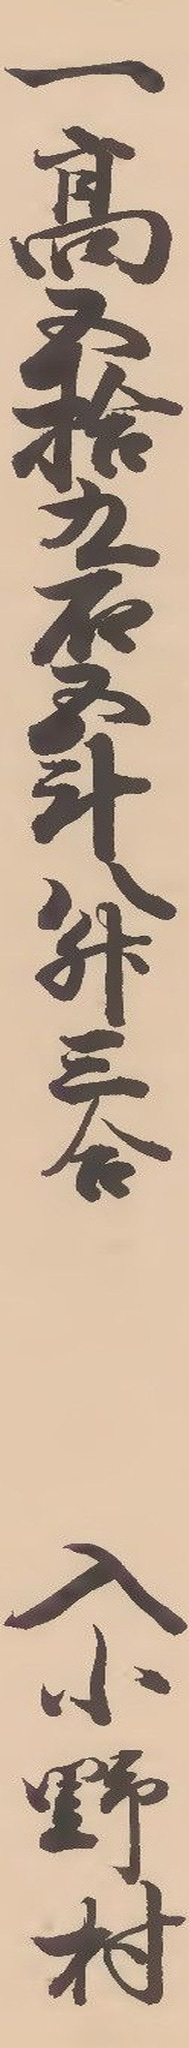一高五拾九石五斗八升三合入小野村

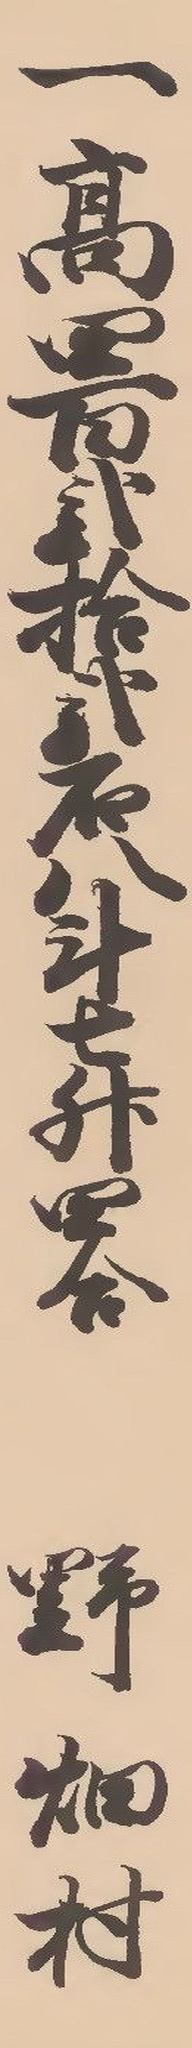一高四百弐拾弐石八斗七升四合野畑村
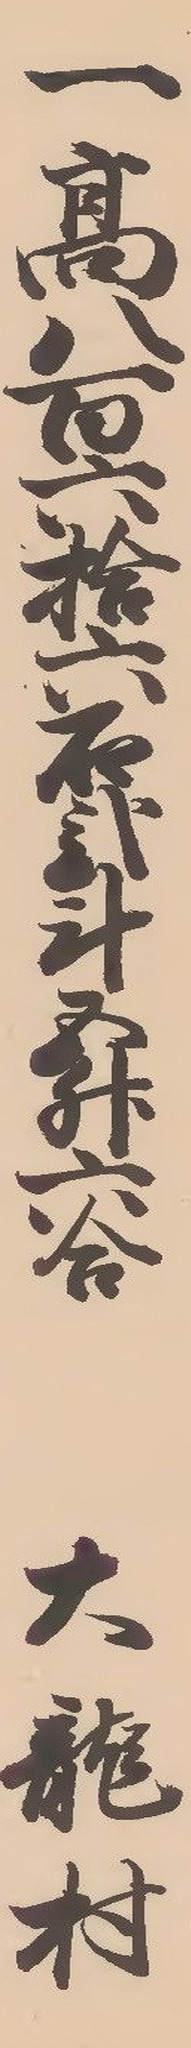一高八百六拾六石弐斗五升六合大竜村
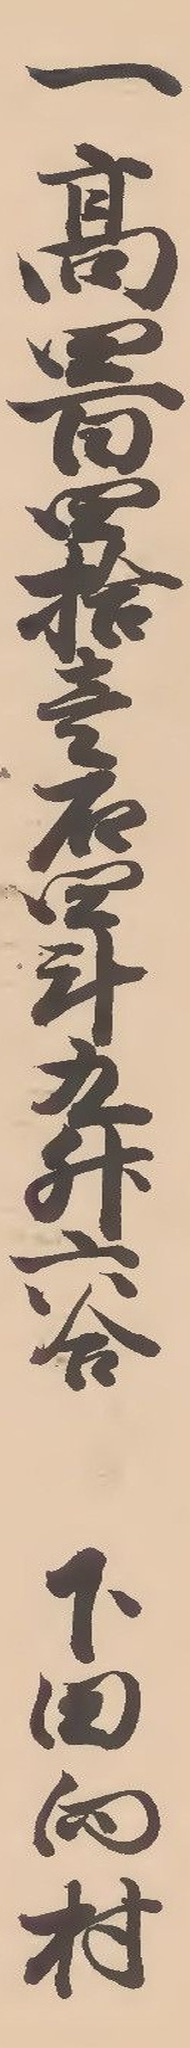一高四百四拾壱石四斗九升六合下田向村
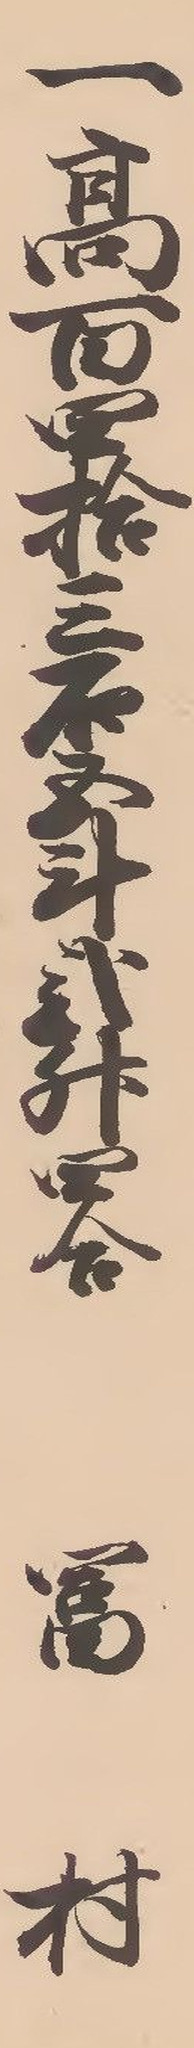一高百四拾三石五斗弐升四合富村
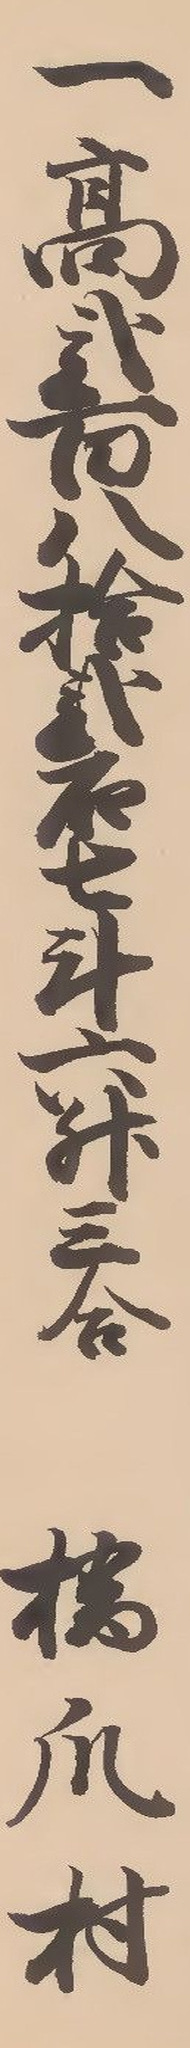一高弐百八拾弐石七斗六升三合橋爪村
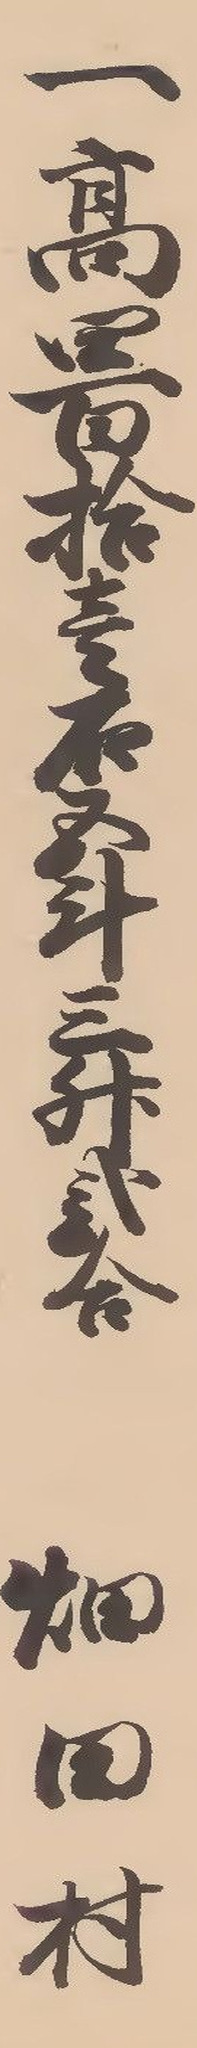一高四百拾壱石五斗三升弐合畑田村
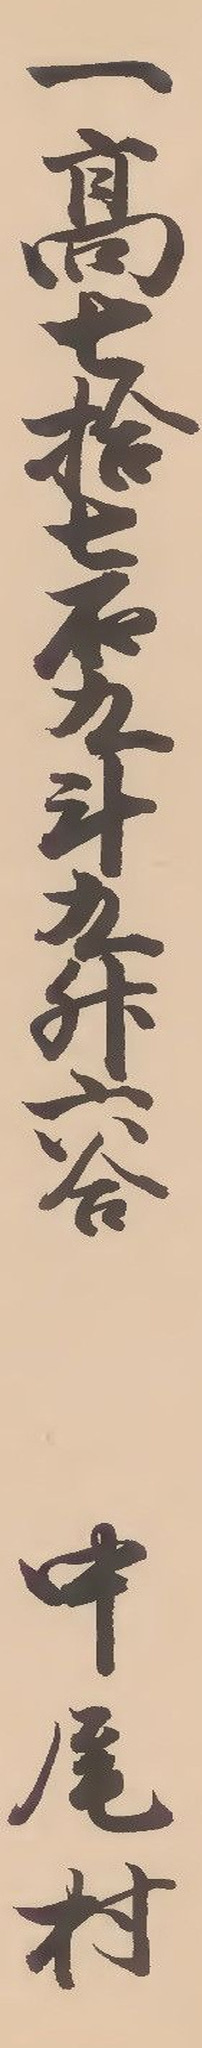一高七拾七石九斗九升六合中尾村
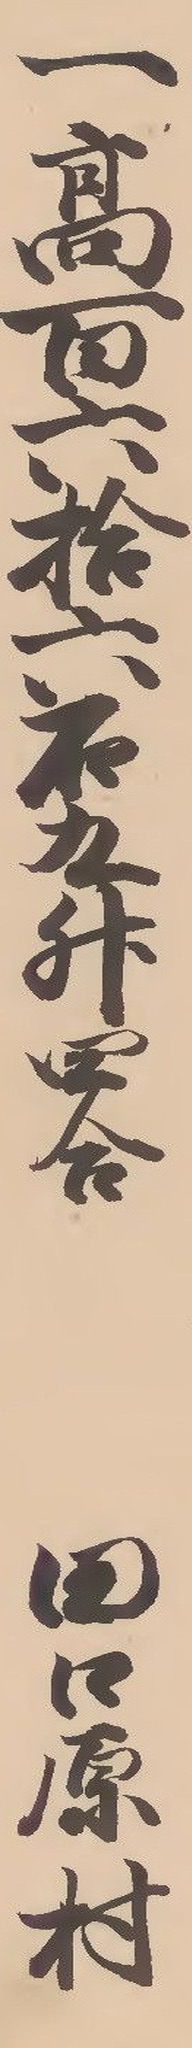一高百六拾六石九升四合田口原村

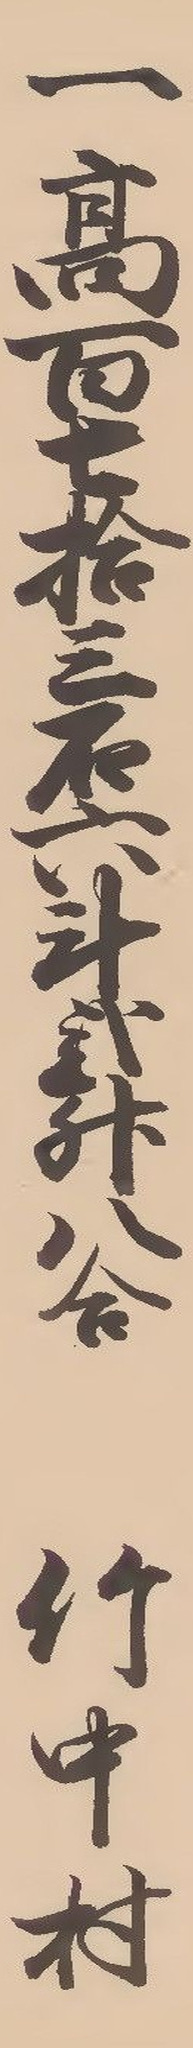一高百七拾三石六斗弐升八合竹中村
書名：豊後国郷帳
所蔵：国立公文書館 National Archives of Japan
